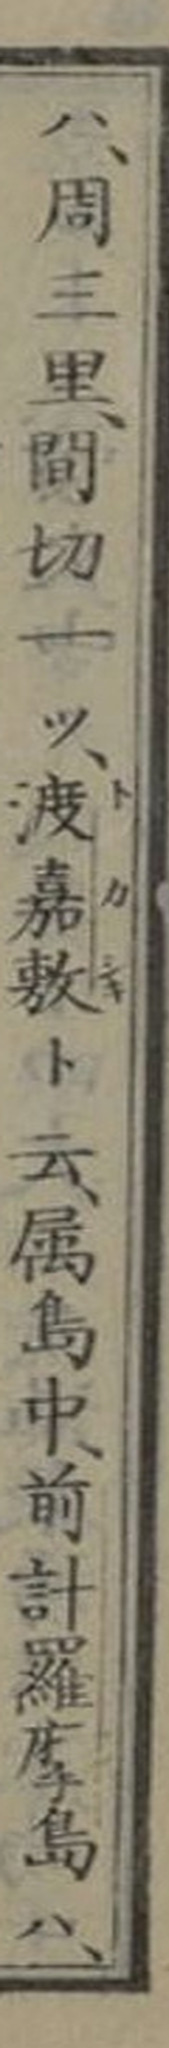ハ、周三里、間切一ツ、渡嘉敷ト云、属島中、前計羅摩島ハ、
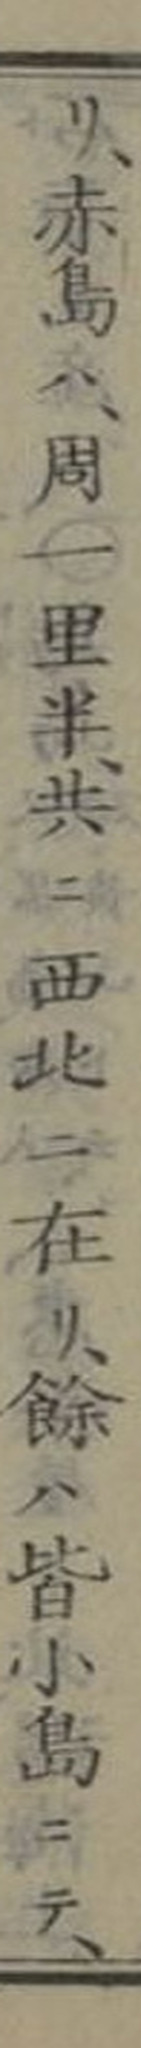リ、赤島ハ、周一里半、共ニ西北ニ在リ、余ハ皆小島ニテ、
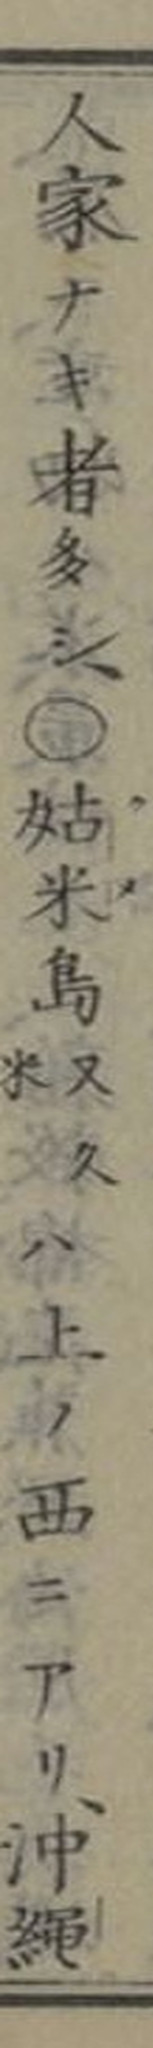人家ナキ者多シ、○姑米島又久米ハ上ノ西ニアリ、沖縄
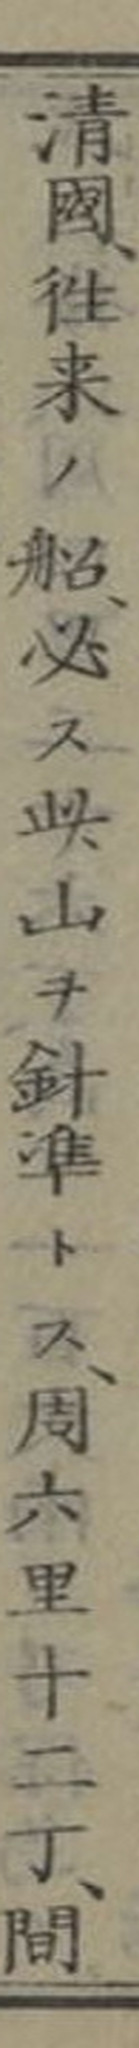清国、往来ノ船、必ス此山ヲ針準トス、周六里十二丁、間
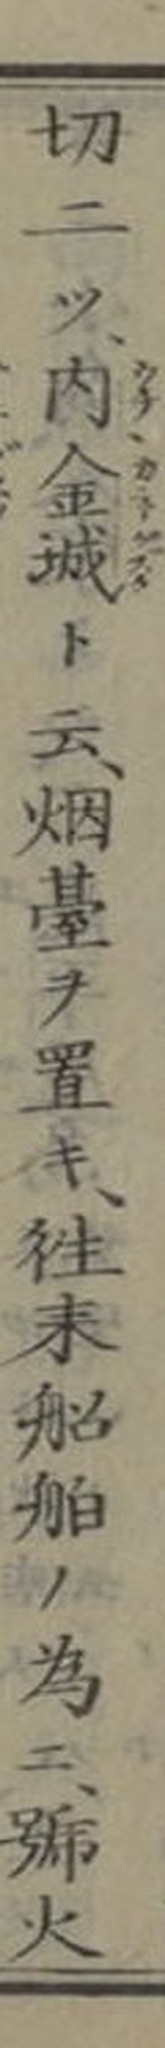切二ツ、内、金城ト云、煙台ヲ置キ、往来船舶ノ為ニ、号火
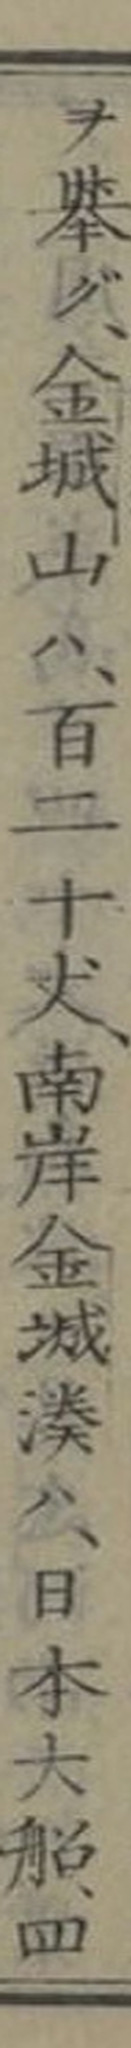ヲ挙グ、金城山ハ、百二十丈、南岸金城湊ハ、日本大船、四
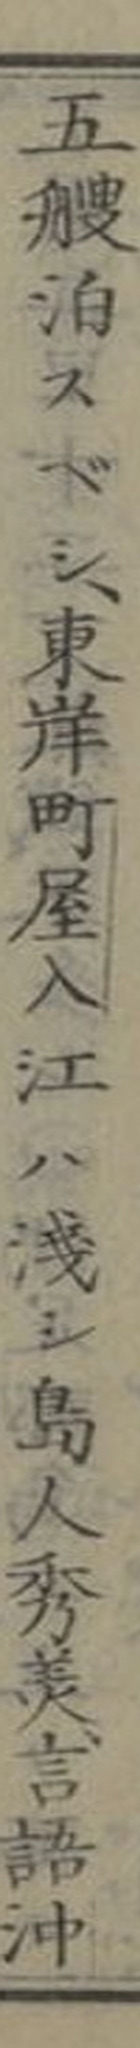五艘泊スベシ、東岸町屋入江ハ浅シ島人秀美、言語沖
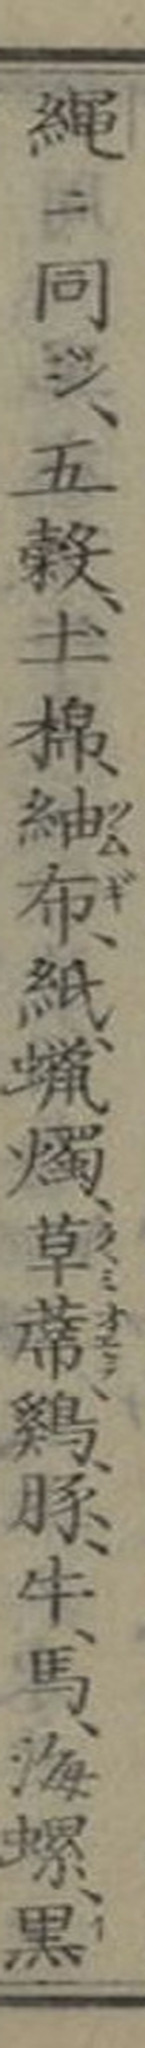縄ニ同ジ、五穀、土棉、紬布、紙、蝋燭、草蓆、鶏、豚、牛、馬、海螺、黒
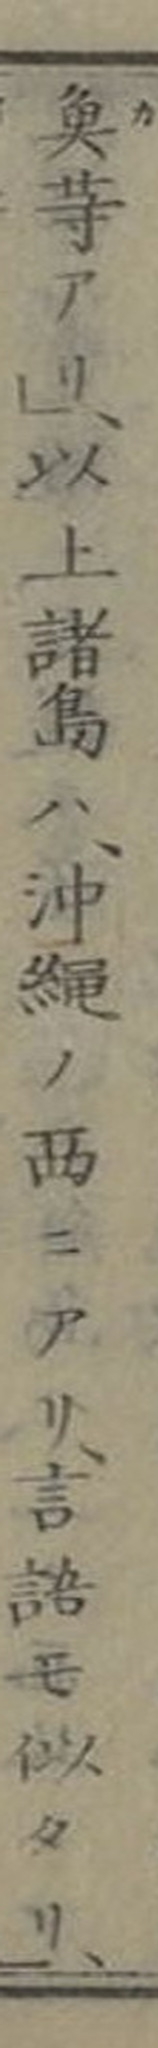魚等アリ、」以上諸島ハ、沖縄ノ西ニアリ、言語モ似タリ、」
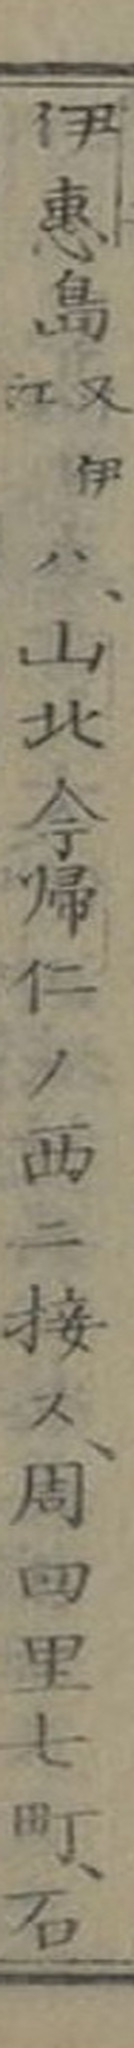伊恵島又伊江ハ、山北今帰仁ノ西ニ接ス、周四里七町、石

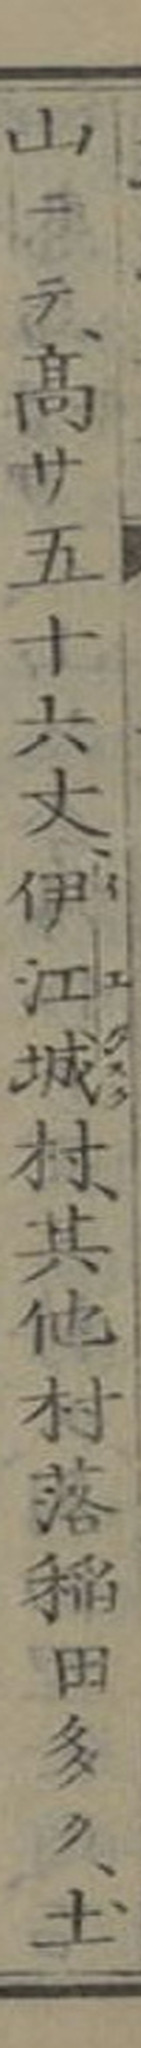山ニテ、高サ五十六丈、伊江城村、其他村落稲田多ク、土
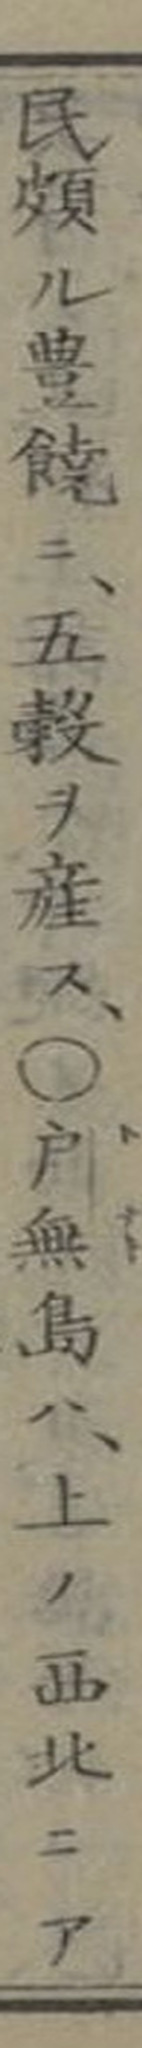民頗ル豊饒ニ、五穀ヲ産ス、○戸無島ハ、上ノ西北ニア
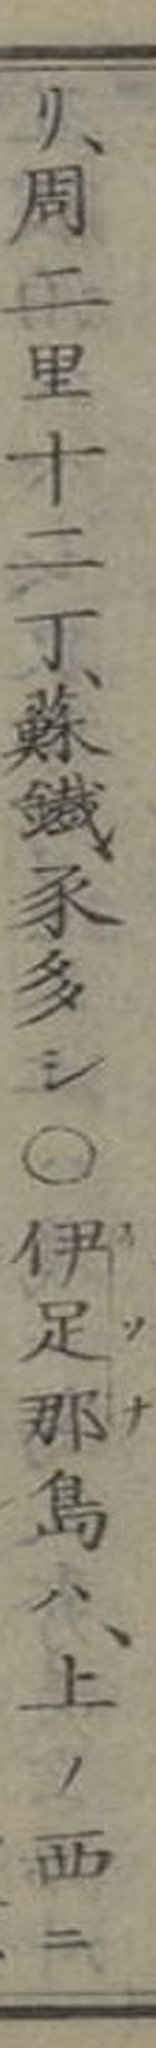リ、周二里十二丁、蘇鉄豕多シ○伊足那島ハ、上ノ西ニ
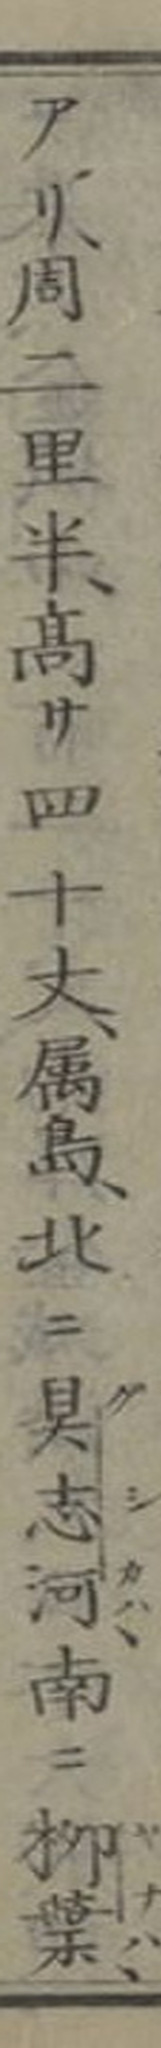アリ、周二里半、高サ四十丈、属島、北ニ具志河、南ニ柳葉、
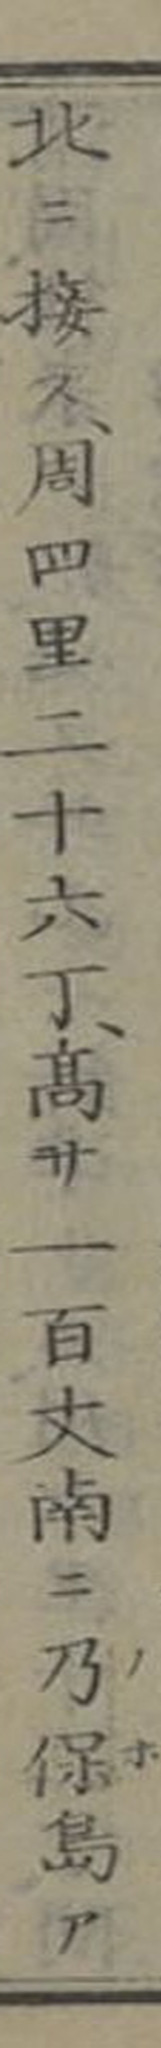北ニ接ス、周四里二十六丁、高サ一百丈南ニ乃保島ア
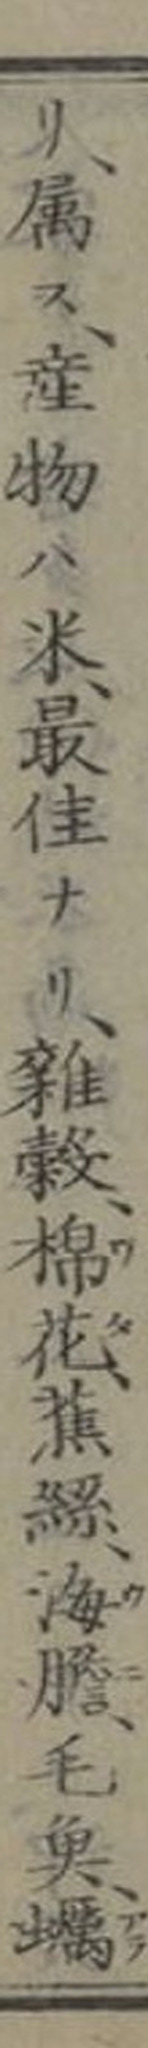リ、属ス、産物ハ米、最佳ナリ、雑穀、棉花、蕉糸、海胆、毛魚、蠣
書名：琉球新誌 図附 上
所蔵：University of the Ryukyus Library
